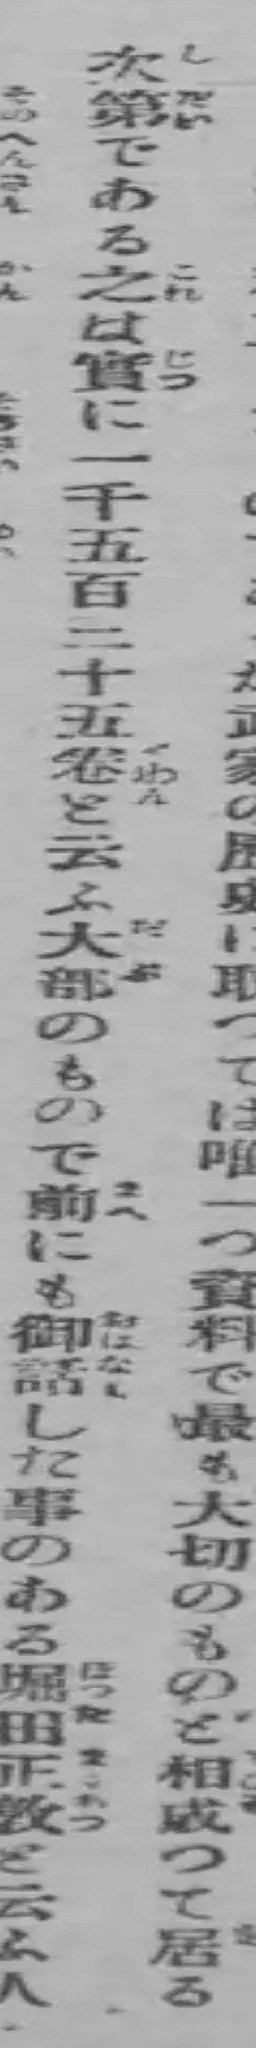次第である之は実に一千五百二十五巻と云ふ大部のもので前にも御話した事のある堀田正敦と云ふ人
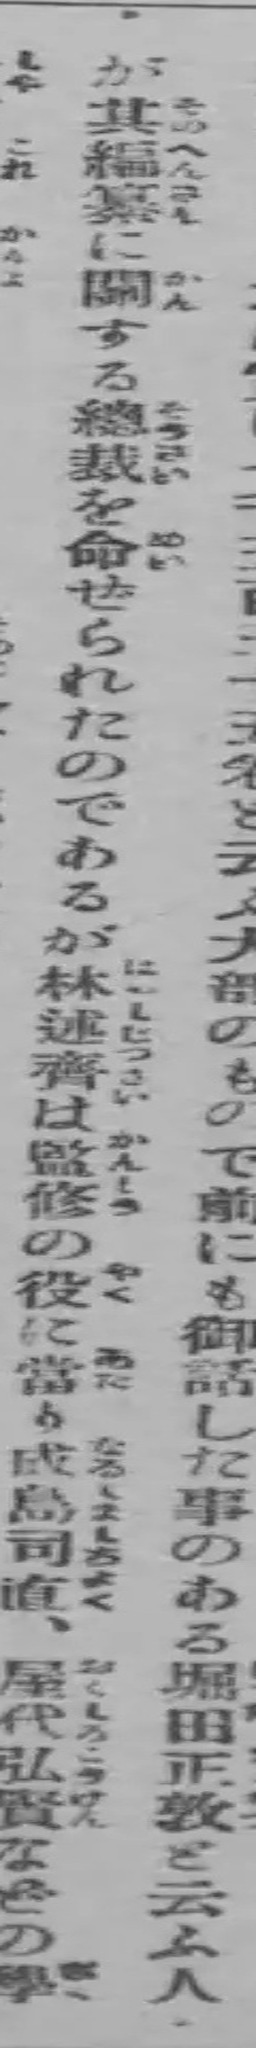が其編纂に関する総裁を命ぜられたのであるが林述斉は監修の役に当り成島司直、屋代弘賢などの学
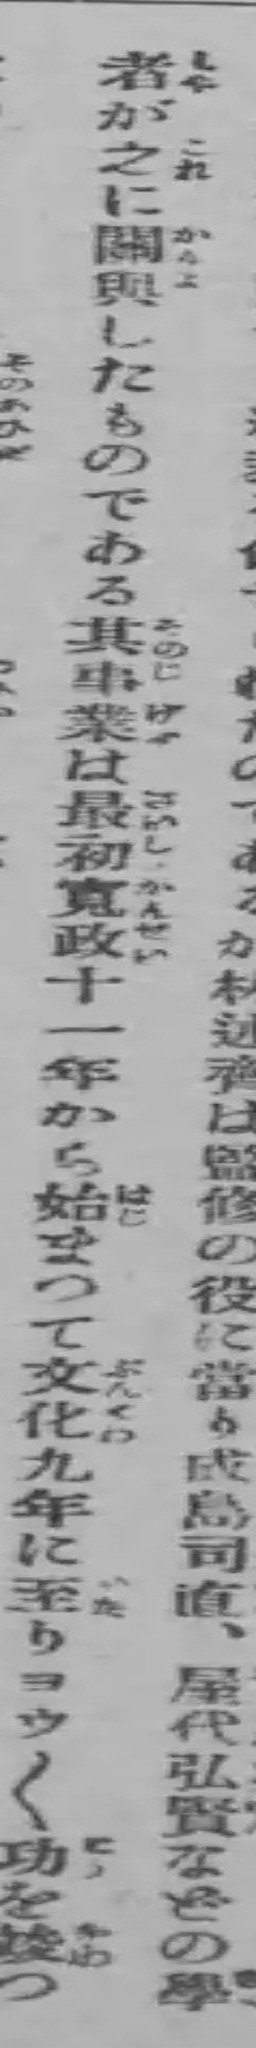者が之に関与したものである其事業は最初寛政十一年から始まつて文化九年に至りヨウ〳〵巧を竣つ
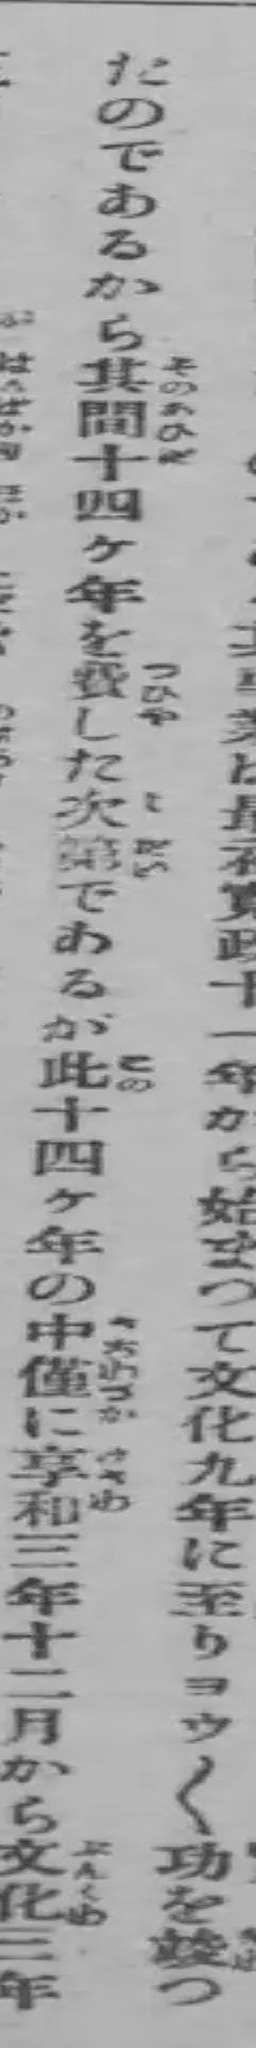たのであるから其間十四ケ年を費した次第であるが此十四ケ年の中僅に享和三年十二月から文化三年
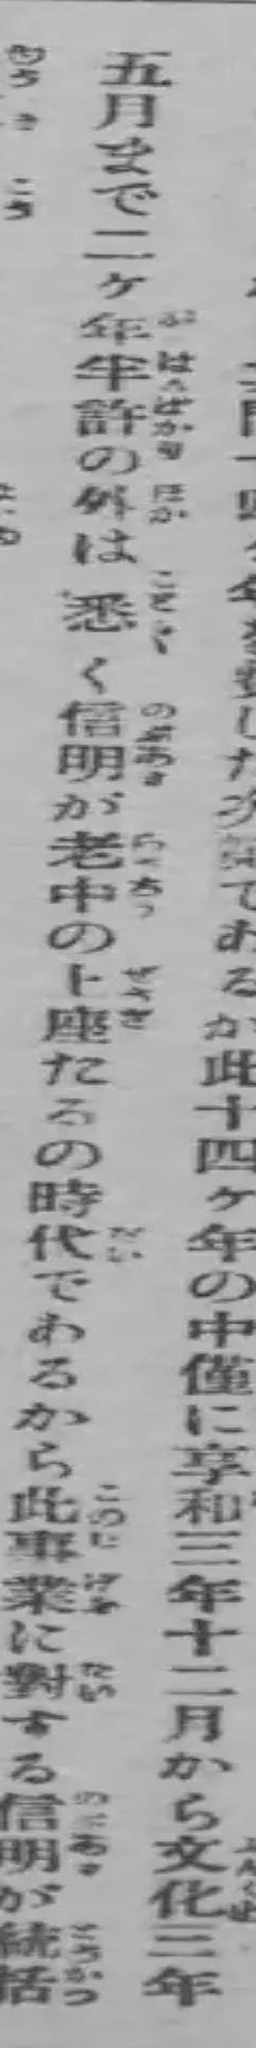五月まで二ケ年半許の外は悉く信明が老中の上座たるの時代であるから此事業に対する信明が統括
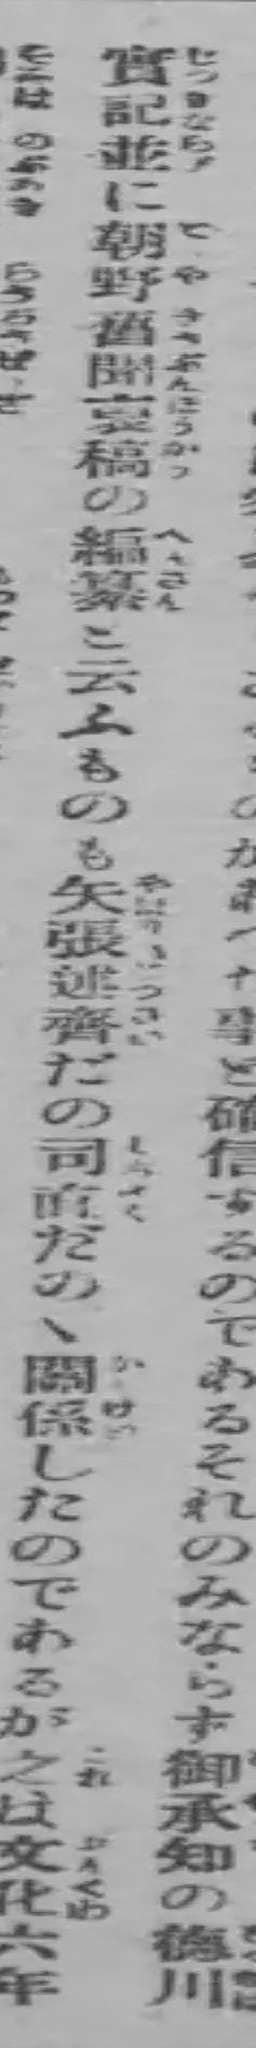実記並に朝野旧聞裒稿の編纂と云ふものも矢張述斉だの司直だのゝ関係したのであるが之は文化六年
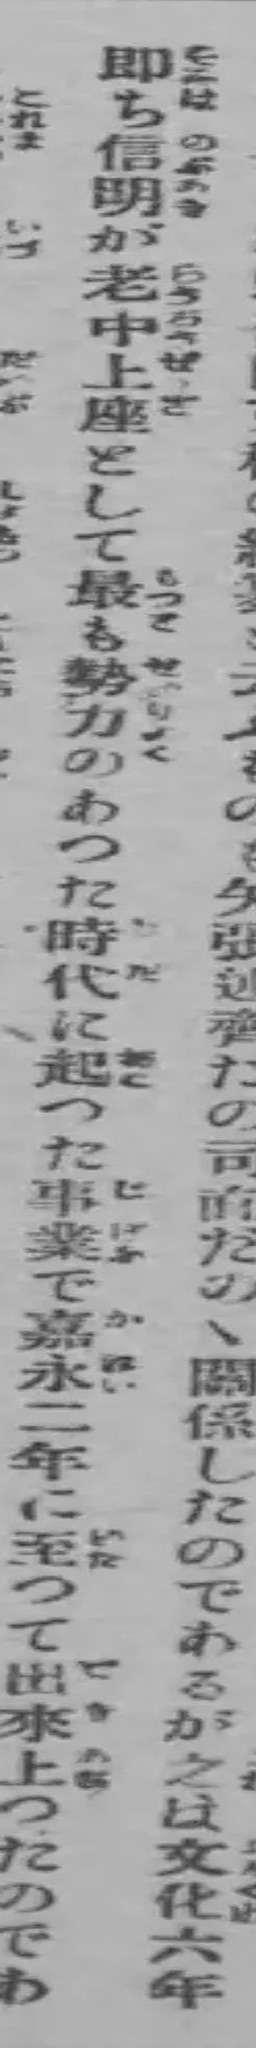即ち信明が老中上座として最も勢力のあつた時代に起つた事業で嘉永二年に至つて出来上つたのであ
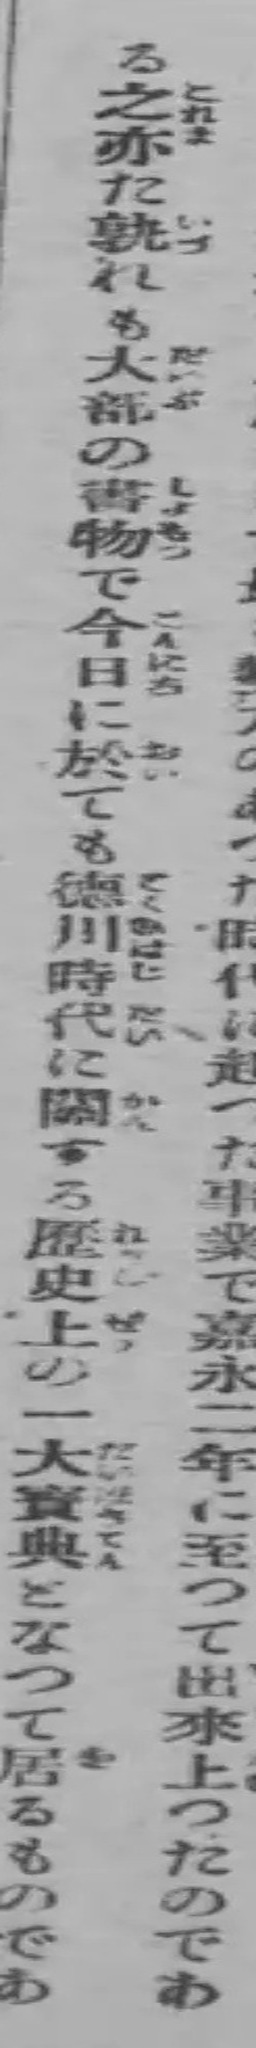る之亦た孰れも大部の書物で今日に於ても徳川時代に関する歴史上の一大宝典となつて居るものであ
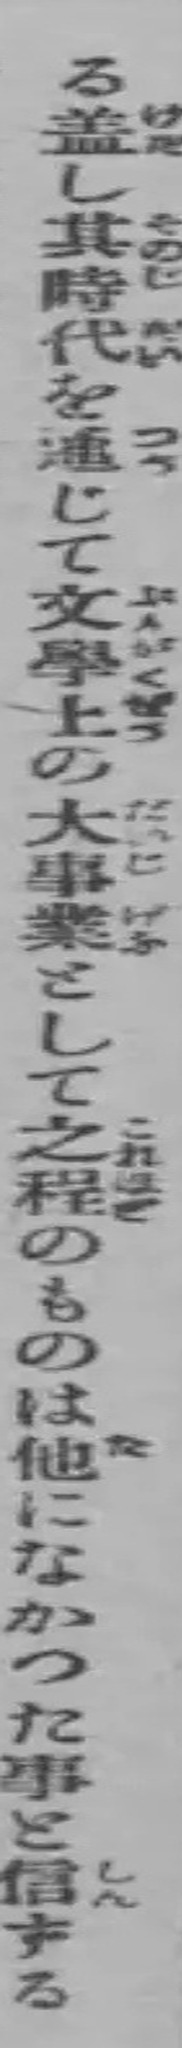る蓋し其時代を通じて文学上の大事業として之程のものは他になかつた事と信ずる
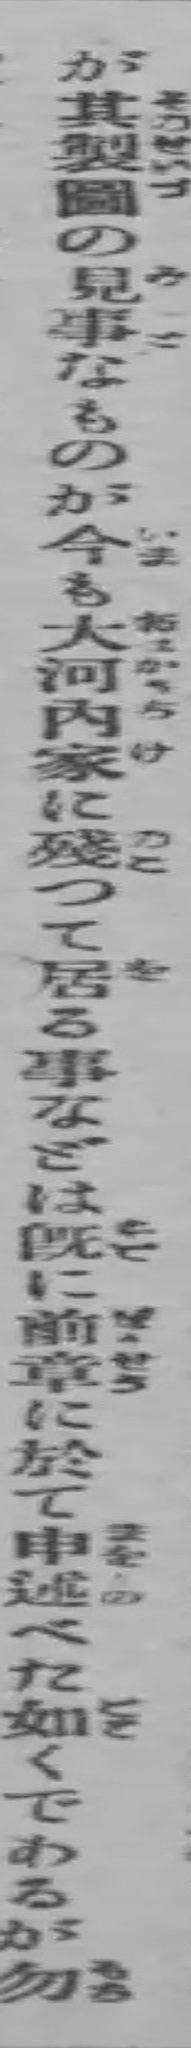が其製図の見事なものが今も大河内家に残つて居る事などは既に前章に於て申述べた如くであるが勿
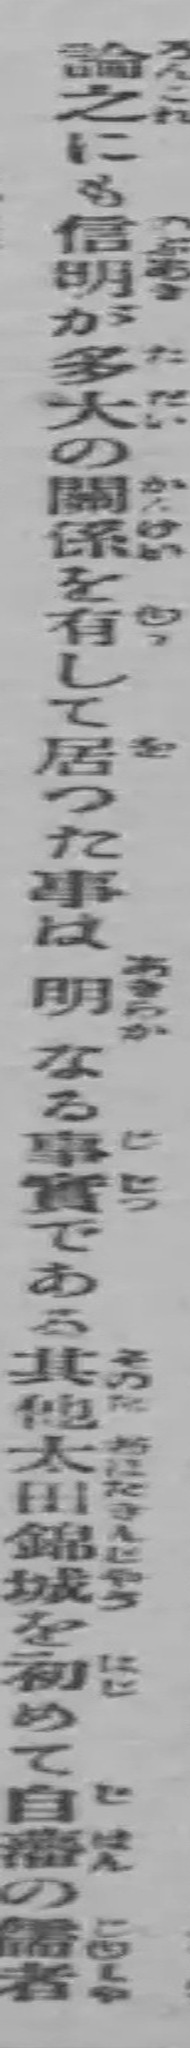論之にも信明が多大の関係を有して居つた事は明なる事実である其他太田錦城を初めて自藩の儒者
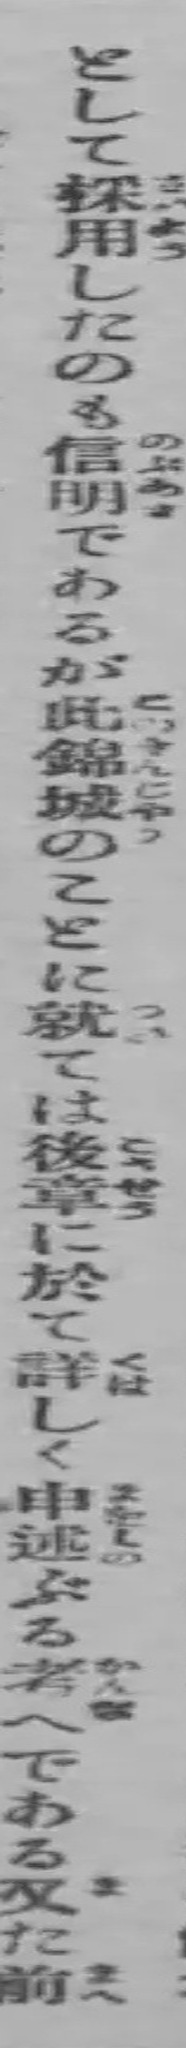として採用したのも信明であるが此錦城のことに就ては後章に於て詳しく申述ぶる考へである又た前
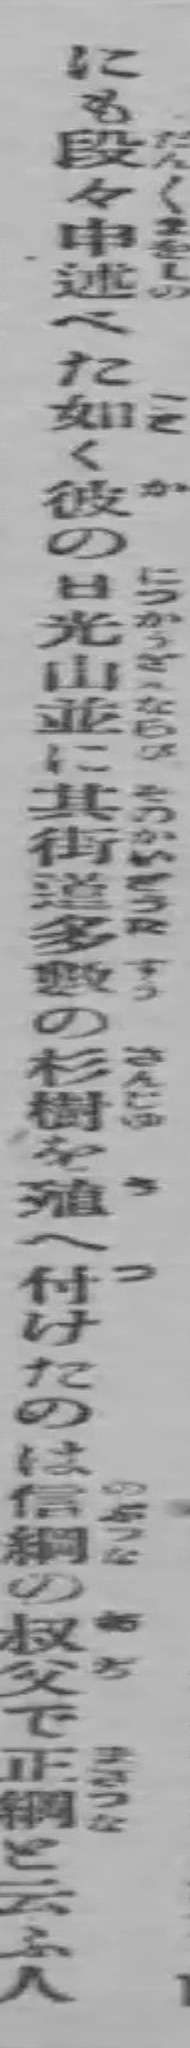日光山殖林にも段々申述べた如く彼のに日光山並に其街道多数の杉樹を殖へ付けたのは信綱の叔父で正綱と云ふ人
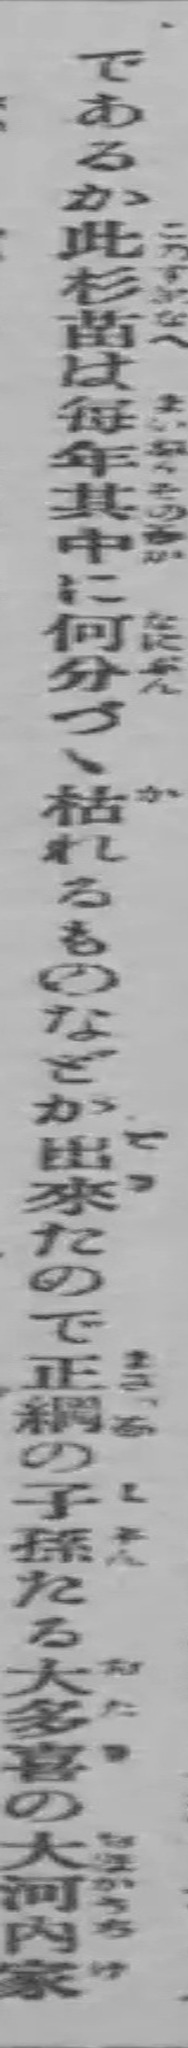であるが此杉苗は毎年其中に何分づゝ枯れるものなどが出来たので正綱の子孫たる大多喜の大河内家
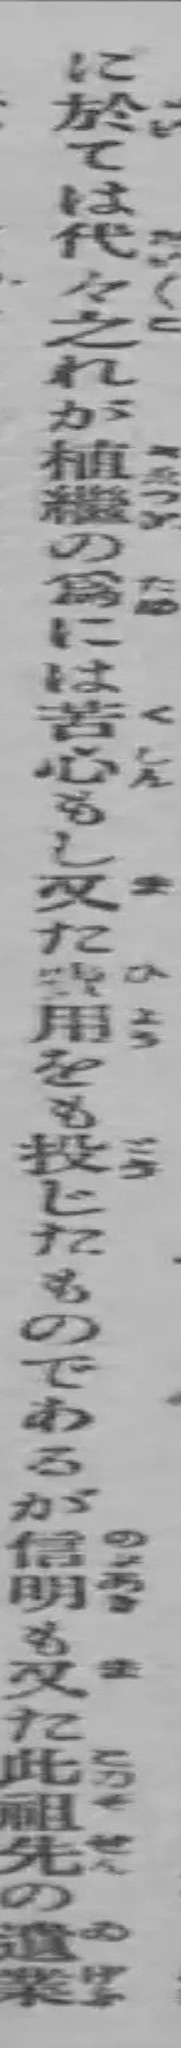に於ては代々之れが植継の為には苦心もし又た費用をも投じたものであるが信明も又た此祖先の遺業
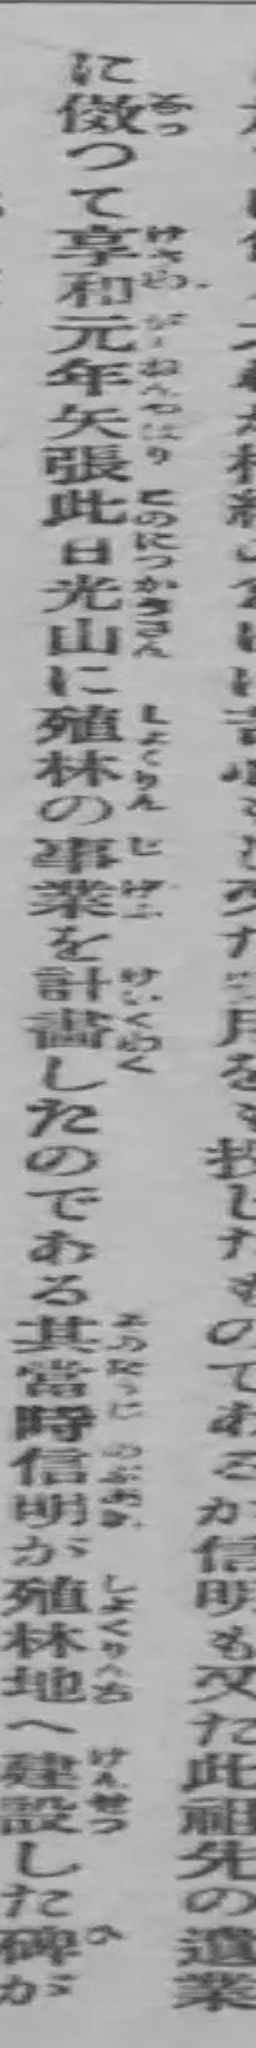に倣つて享和元年矢張此日光山に殖林の事業を計画したのである其当時信明が殖林地へ建設した碑が
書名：豊橋市史談
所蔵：国立国会図書館 National Diet Library, JAPAN
